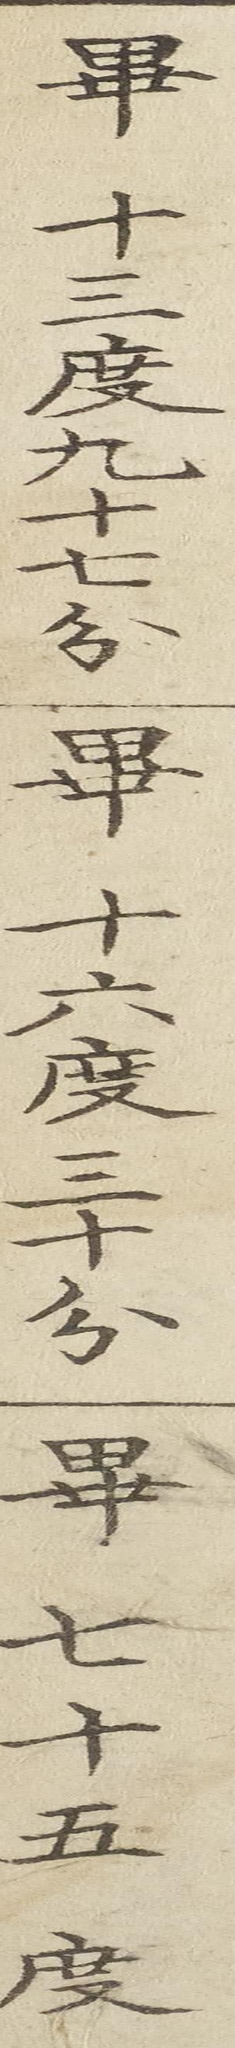畢十三度九十七分畢十六度三十分畢七十五度

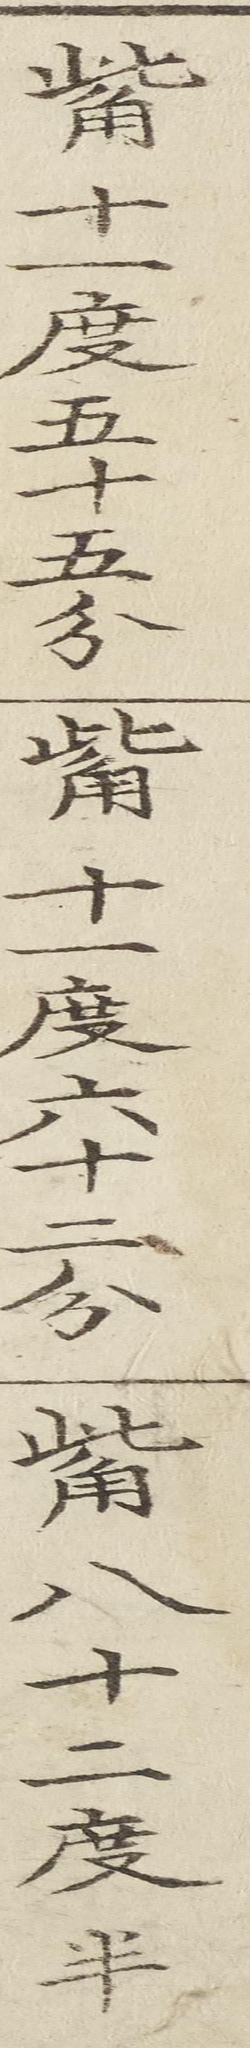觜十一度五十五分觜十一度六十二分觜八十二度半
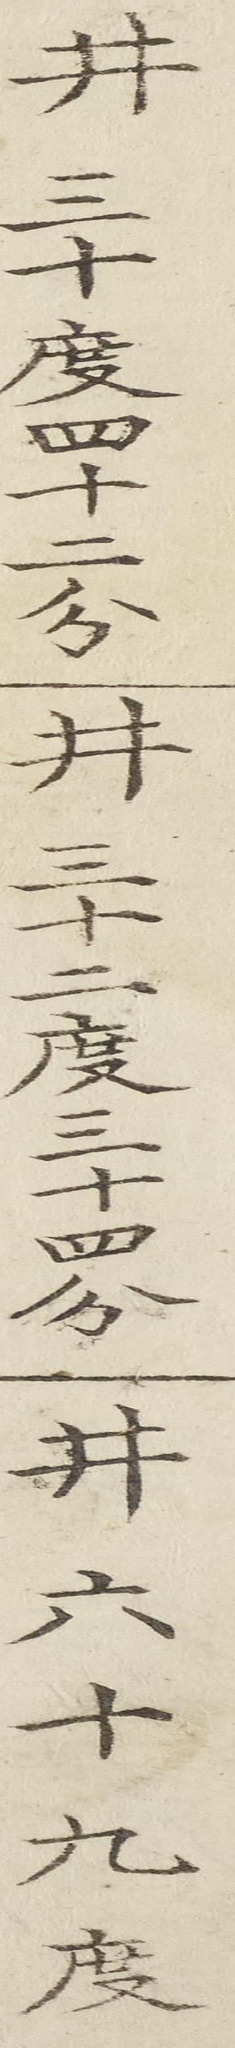井三十度四十二分井三十二度三十四分井六十九度
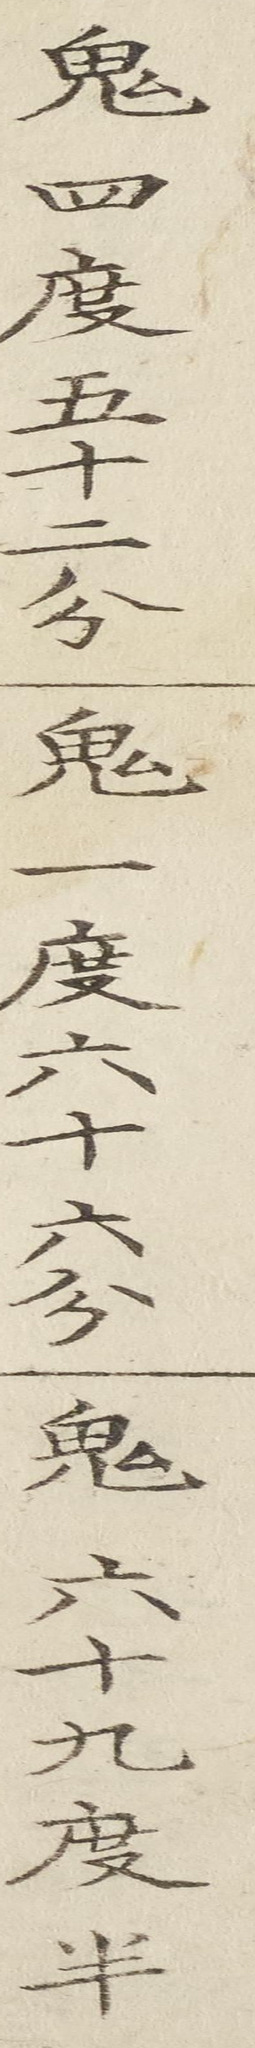鬼四度五十二分鬼一度六十六分鬼六十九度半
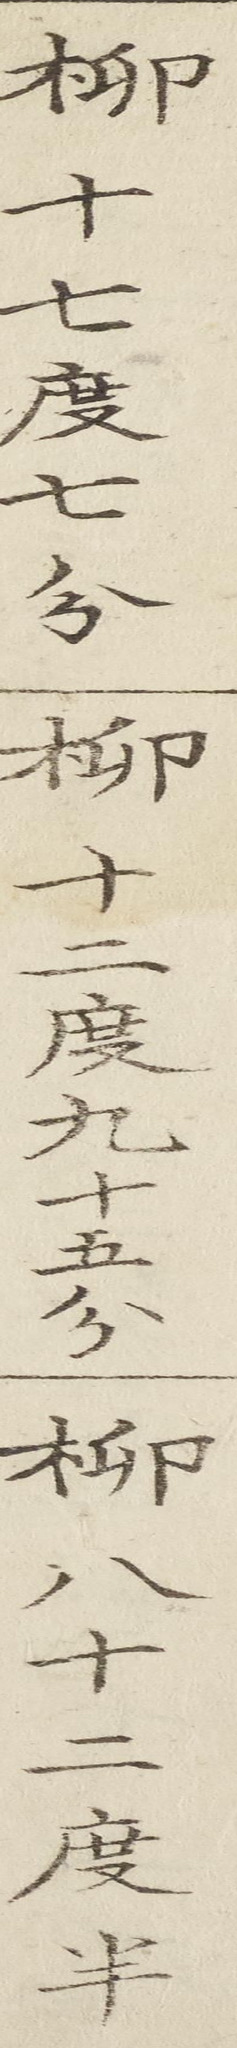柳十七度七分柳十二度九十五分柳八十二度半
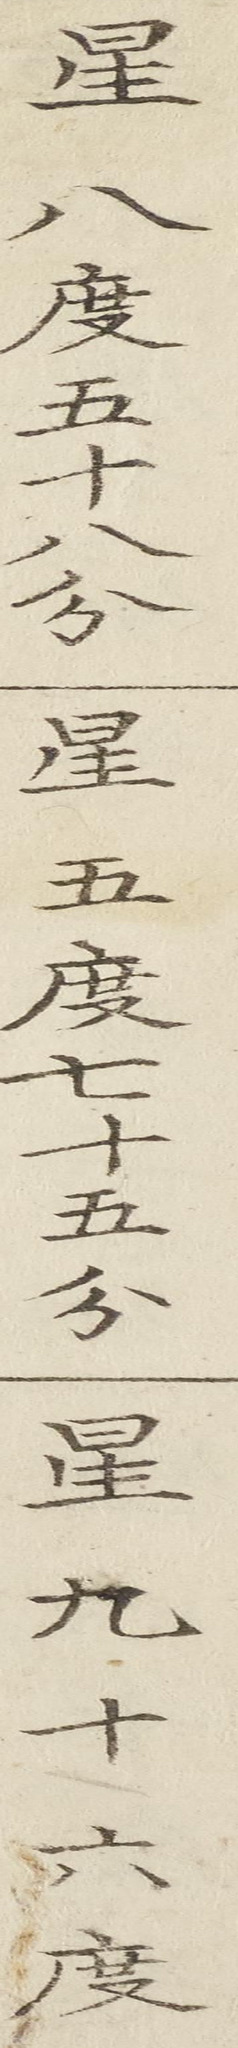星八度五十八分星五度七十五分星九十六度
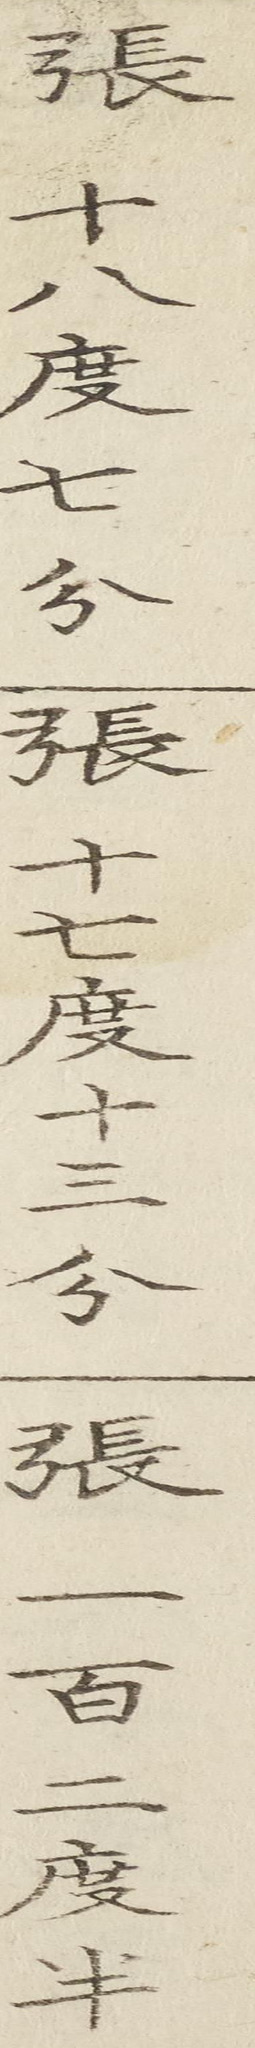張十八度七分張十七度十三分張一百二度半
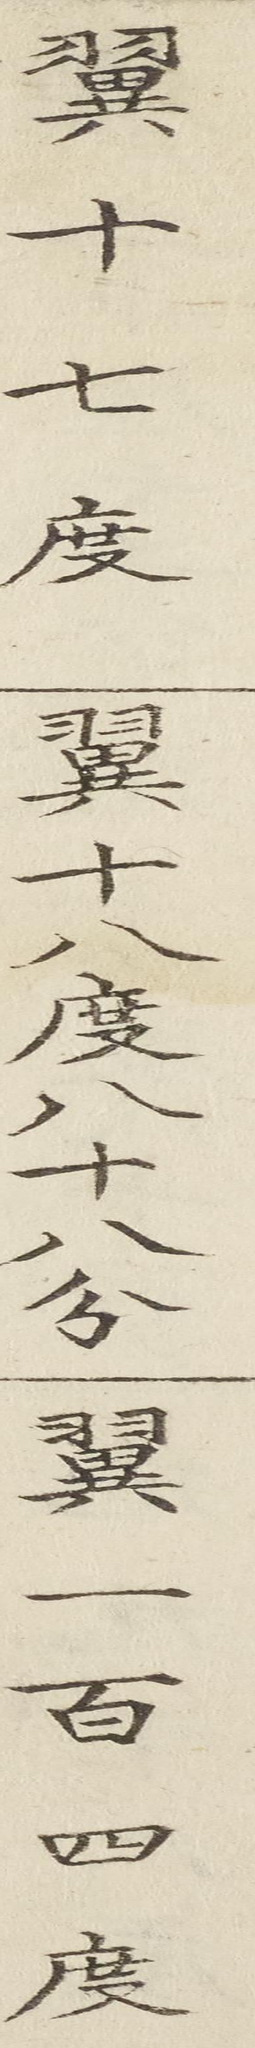翼十七度翼十八度八十八分翼一百四度
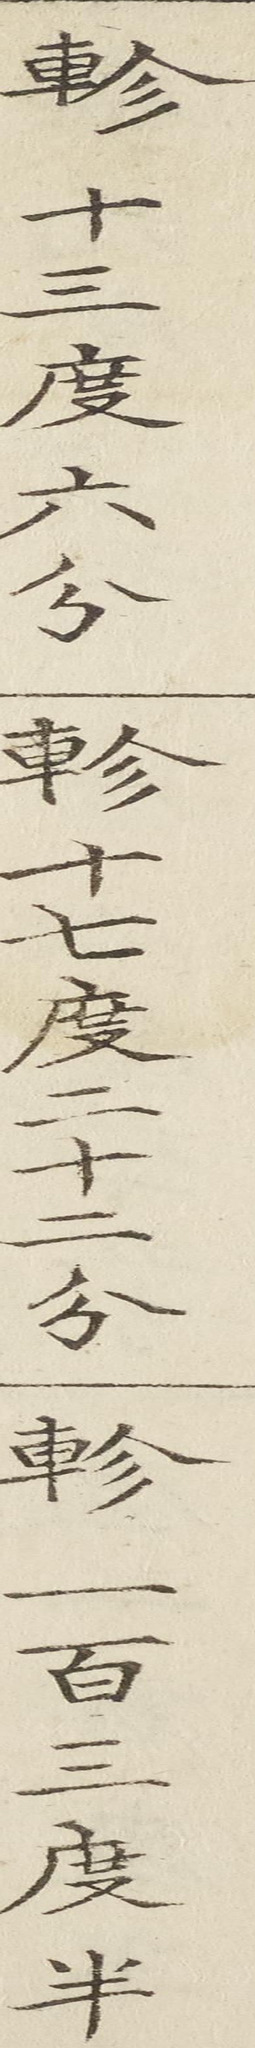軫十三度六分軫十七度二十二分軫一百三度半
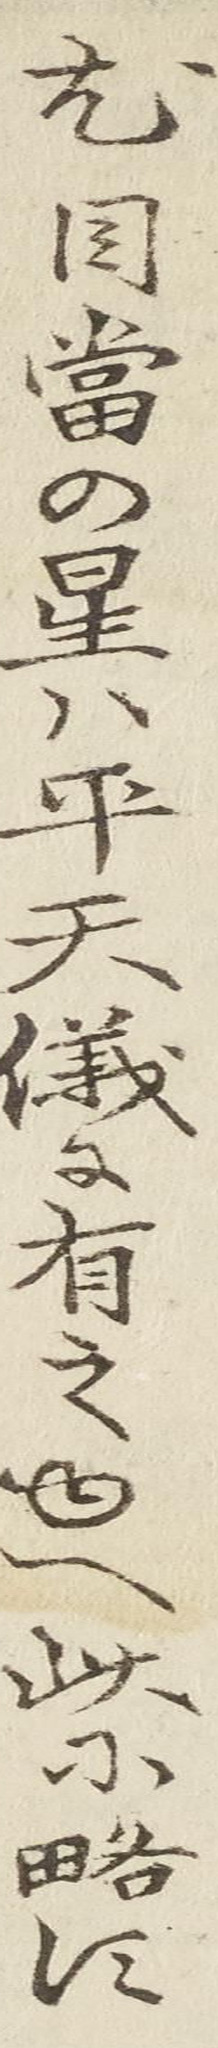尤目当の星は平天儀に有之ゆへ此に略す
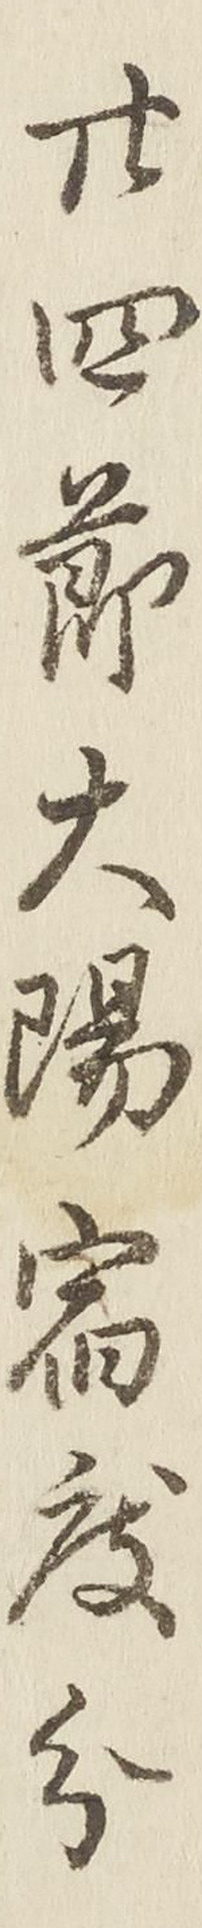廿四節大陽宿度分
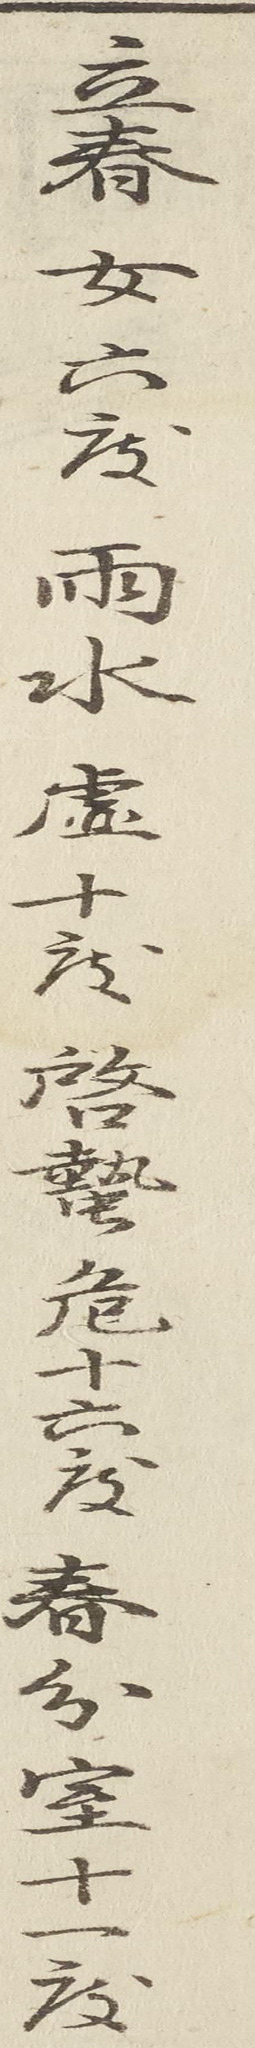立春女六度雨水虚十度啓蟄危十六度春分室十一度
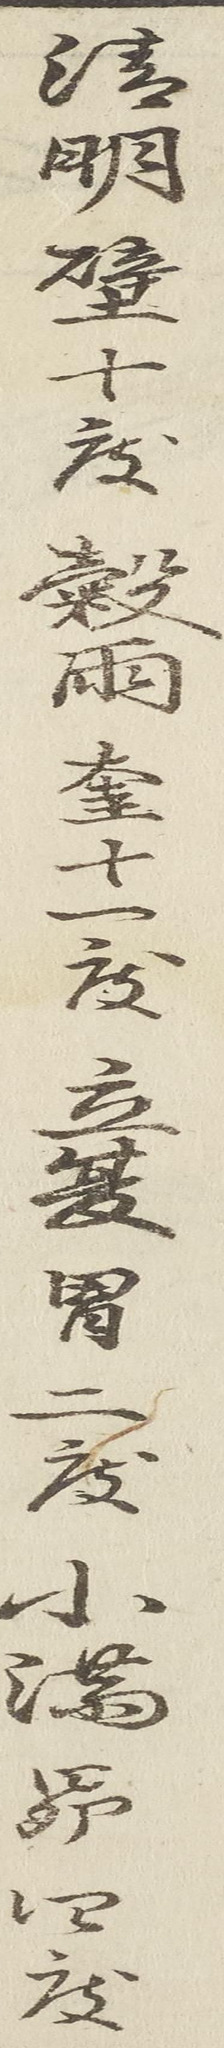清明壁十度穀雨奎十一度立夏胃二度小満昴四度
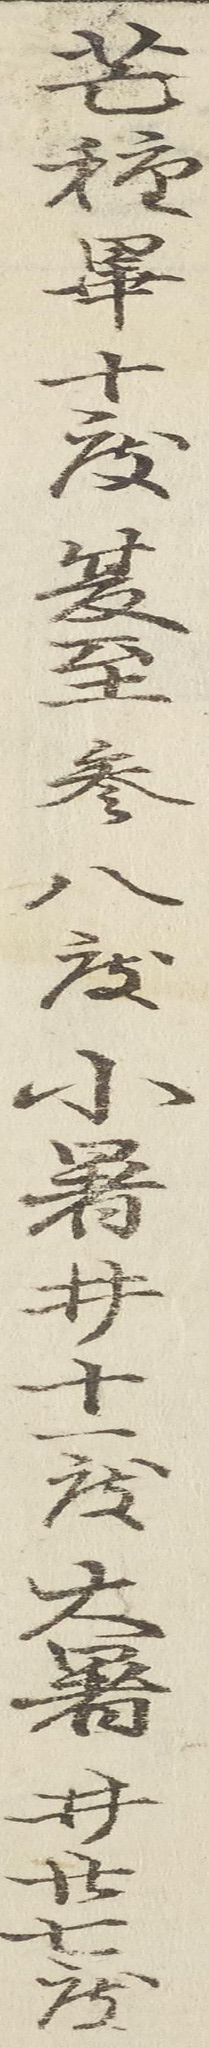芒種畢十度夏至参八度小暑井十一度大暑井廿七度
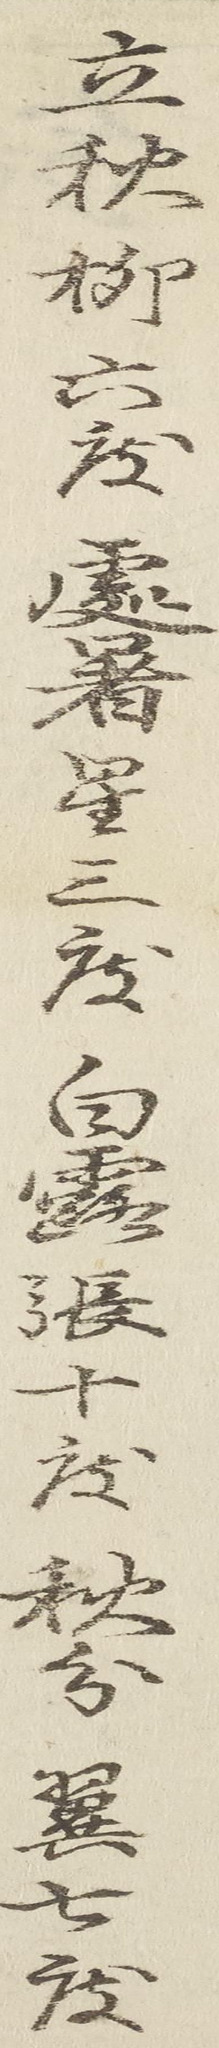立秋柳六度処暑星三度白露張十度秋分翼七度
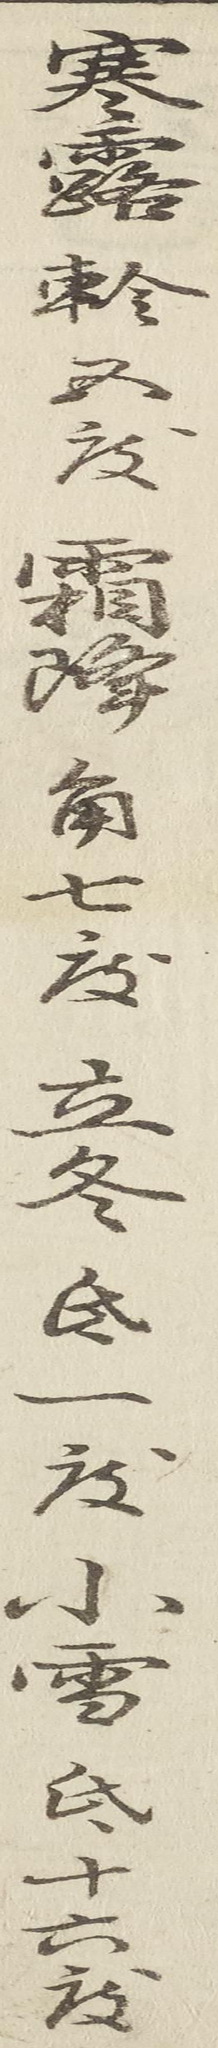寒露軫五度霜降角七度立冬氐一度小雪氐十六度
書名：平天儀圖解
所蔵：東京大学地震研究所図書室 Earthquake Research Institute Library, The University of Tokyo, JAPAN
